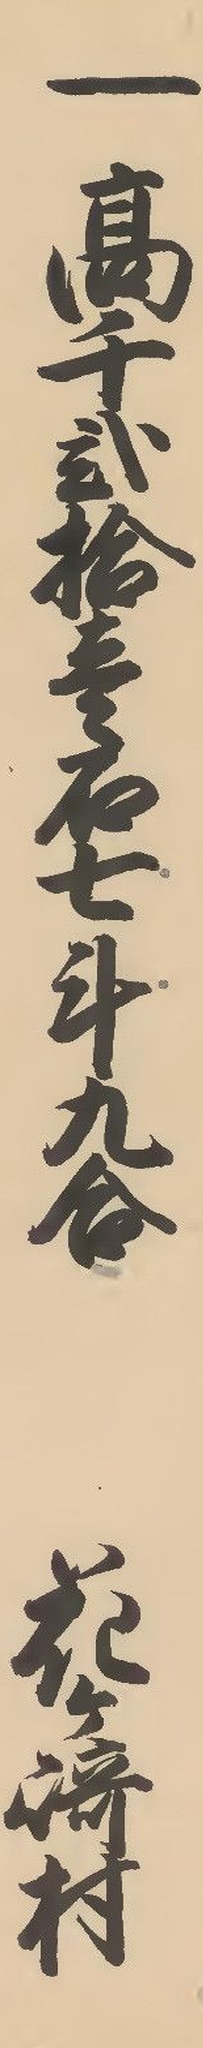一高千弐拾壱石七斗九合花ヶ崎村
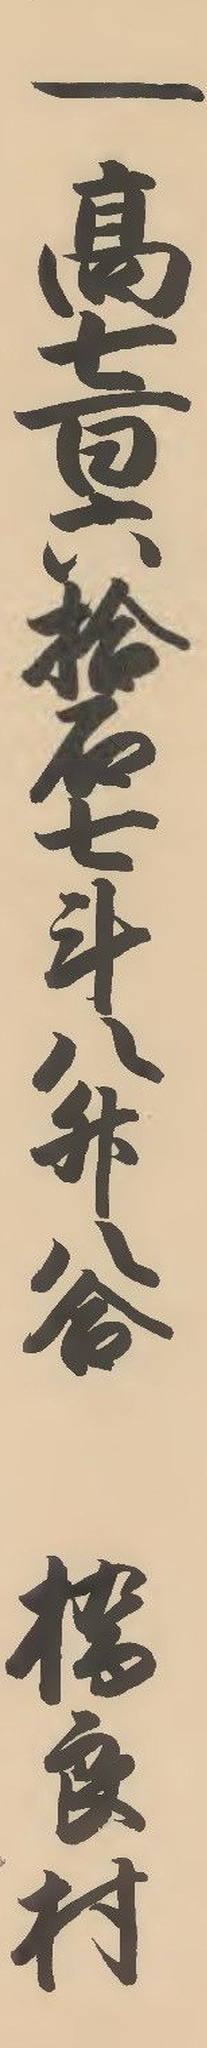一高七百六拾石七斗八升八合橋良村
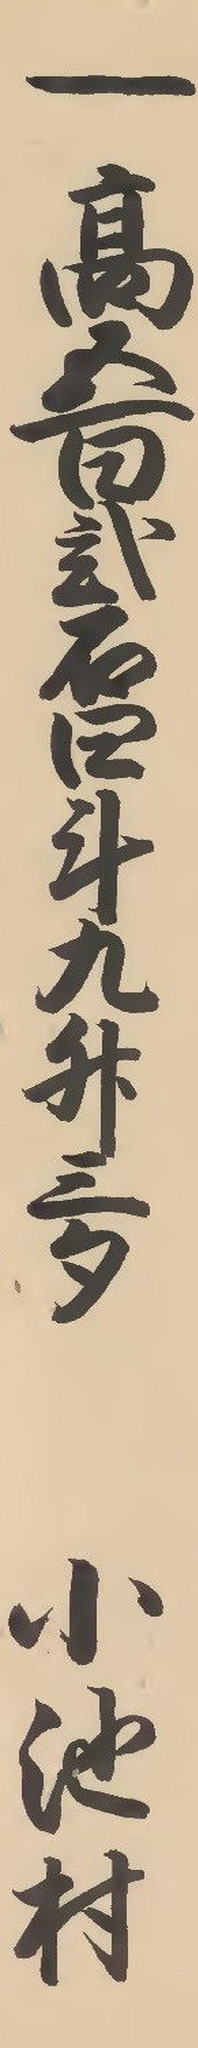一高五百弐石四斗九升三勺小池村
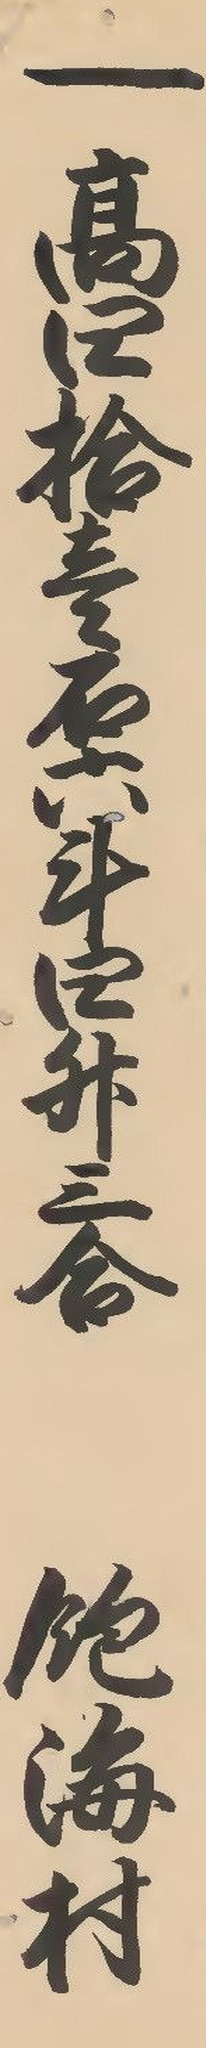一高四拾壱石六斗四升三合飽海村
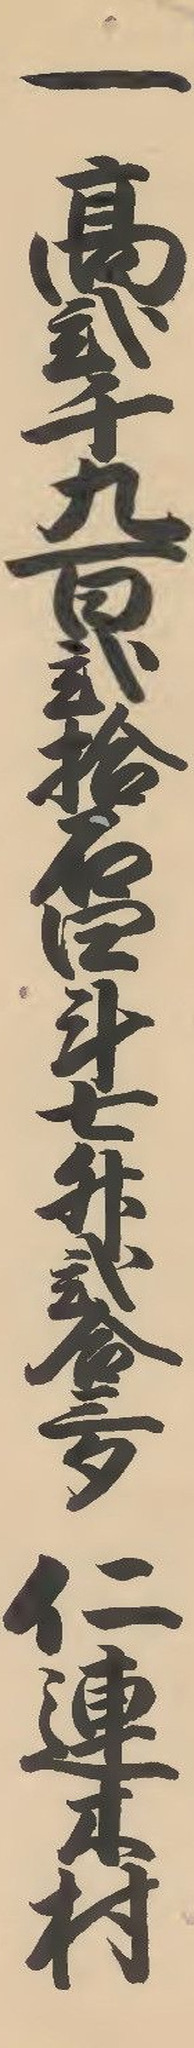一高弐千九百弐拾石四斗七升弐合三勺仁連木村
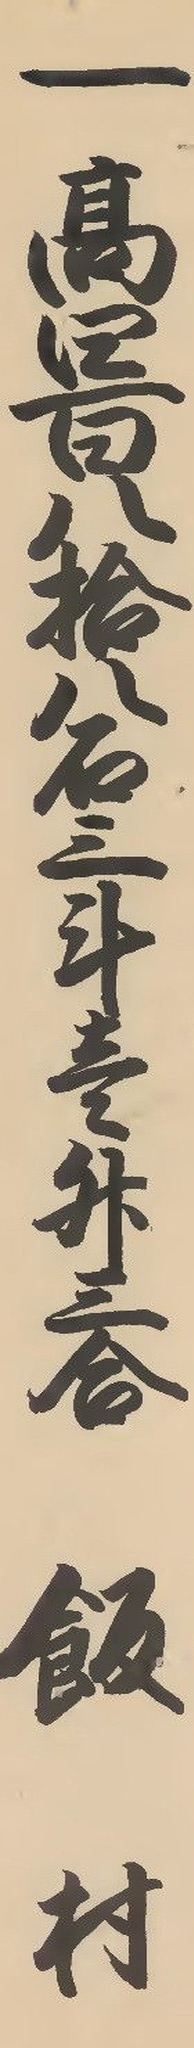一高四百八拾八石三斗壱升三合飯村
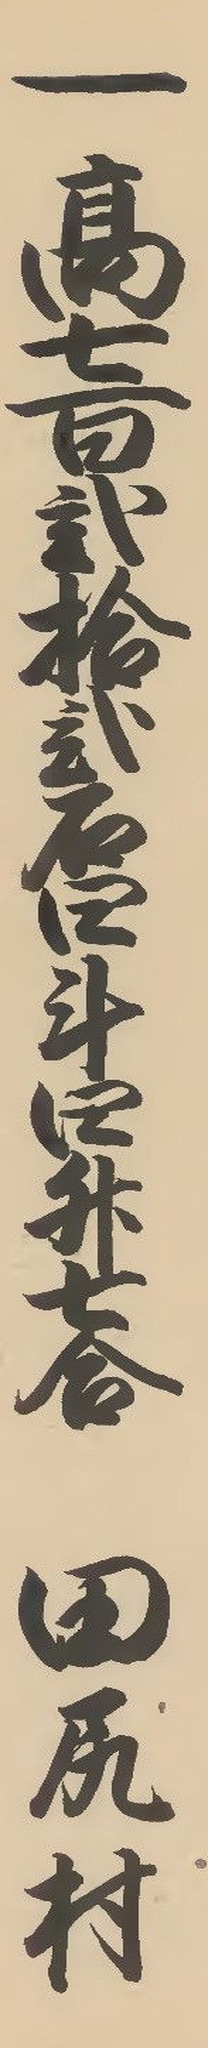一高七百弐拾弐石四斗四升七合田尻村
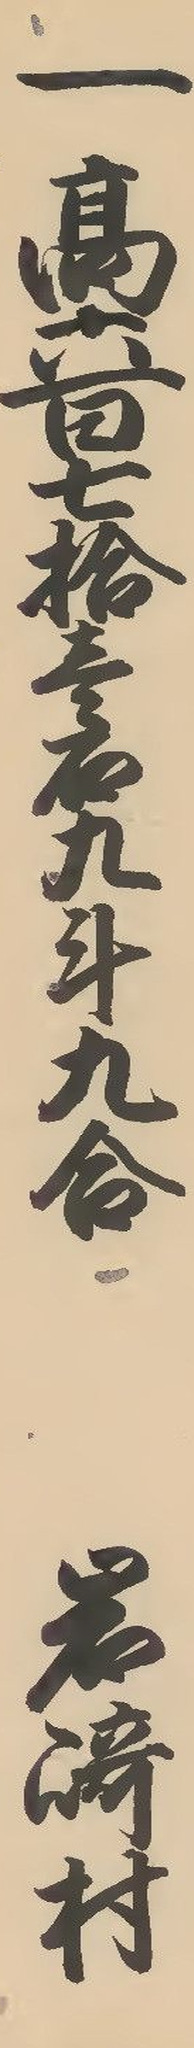一高六百七拾壱石九斗九合岩崎村

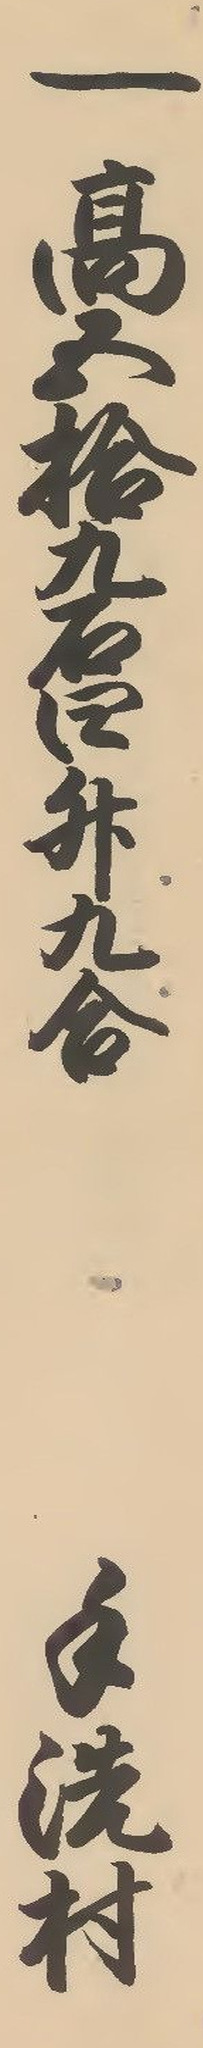一高五拾九石四升九合手洗村
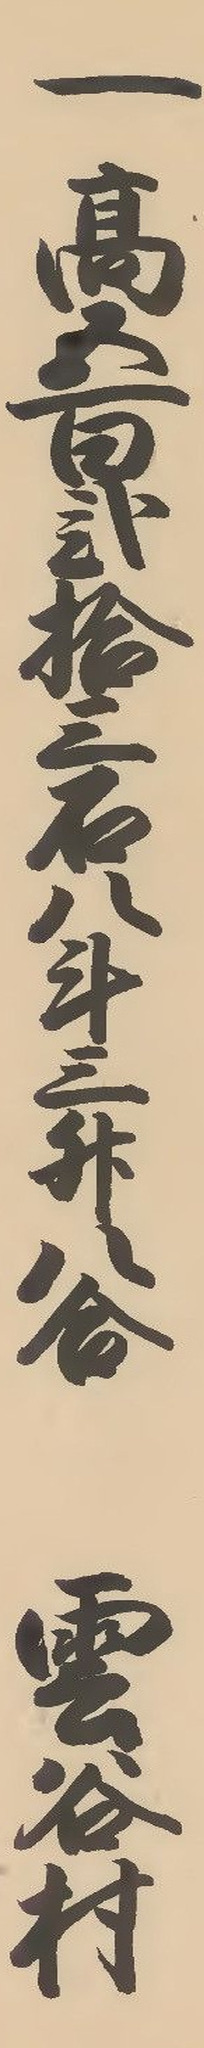一高五百弐拾三石八斗三升八合雲谷村
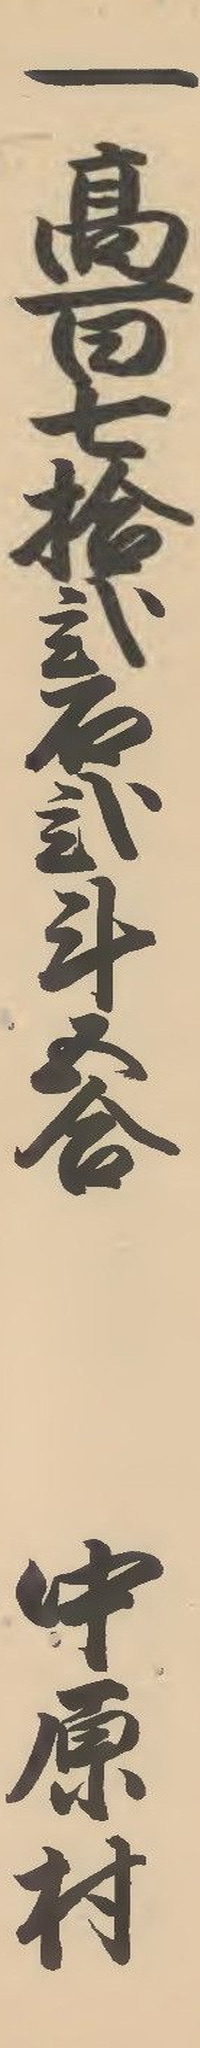一高百七拾弐石弐斗五合中原村
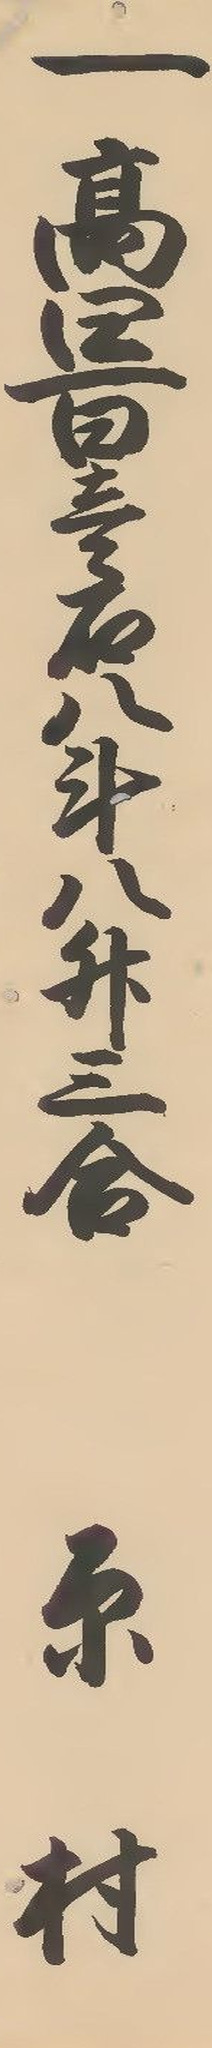一高四百壱石八斗八升三合原村
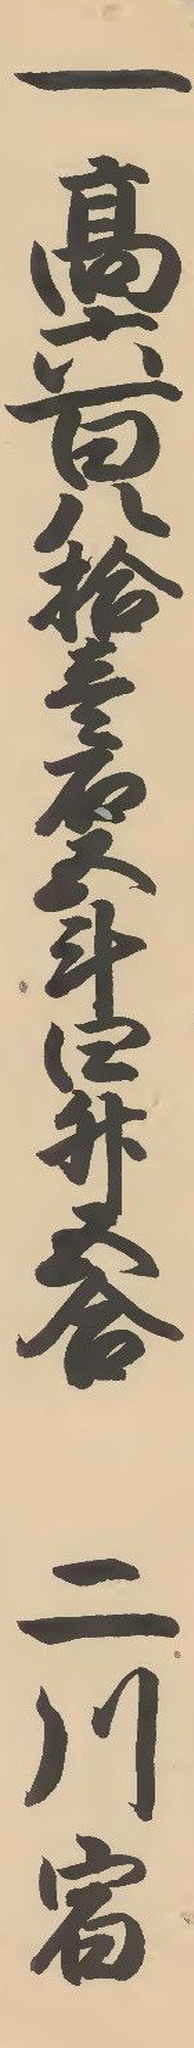一高六百八拾壱石五斗四升五合二川宿
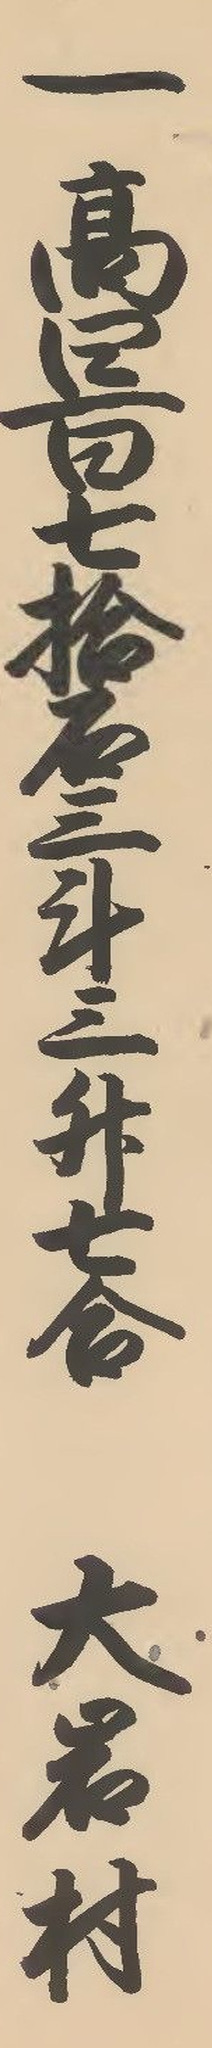一高四百七拾石三斗三升七合大岩村
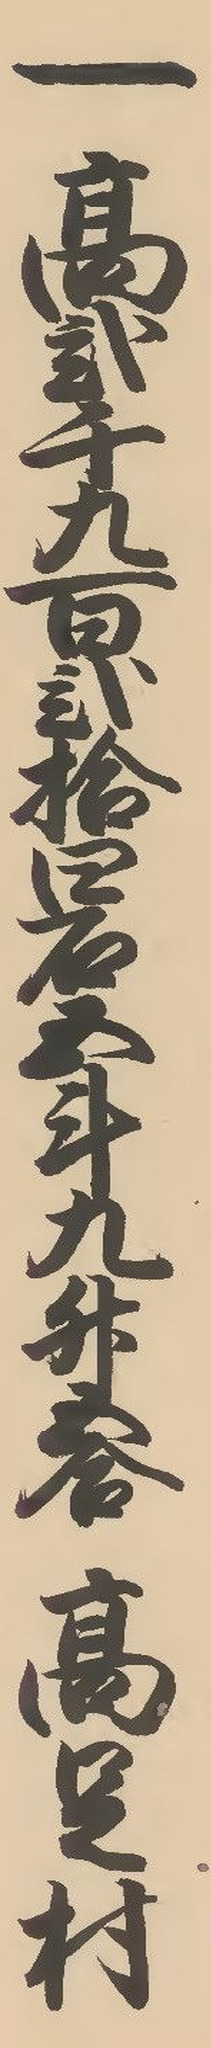一高弐千九百弐拾四石五斗九升五合高足村
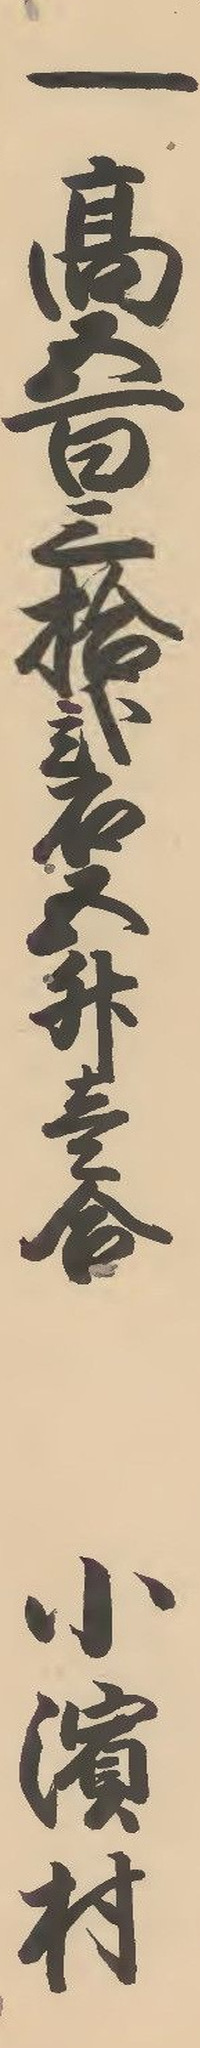一高五百三拾弐石五升壱合小浜村
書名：三河国郷帳
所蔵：国立公文書館 National Archives of Japan
